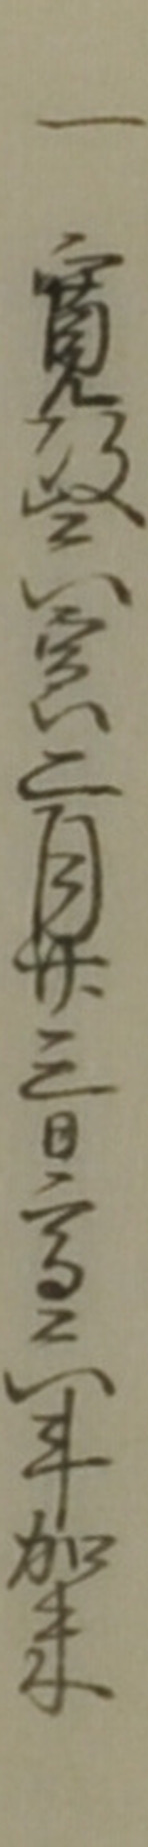一寛政六寅二月廿三日高六斗加米
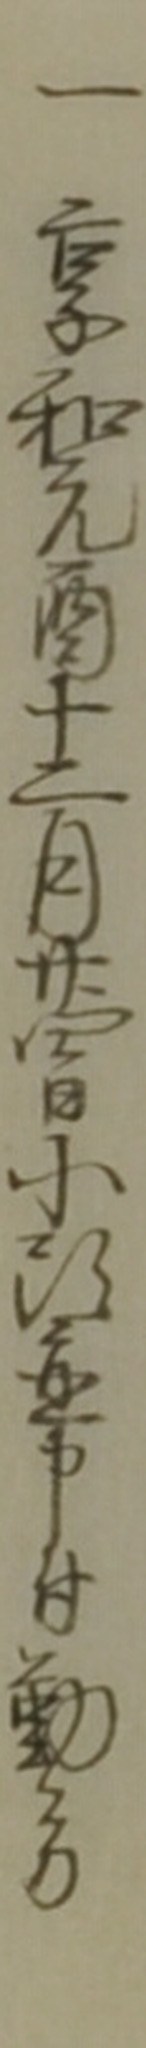一享和元酉十二月廿四日小頭並申付勤方
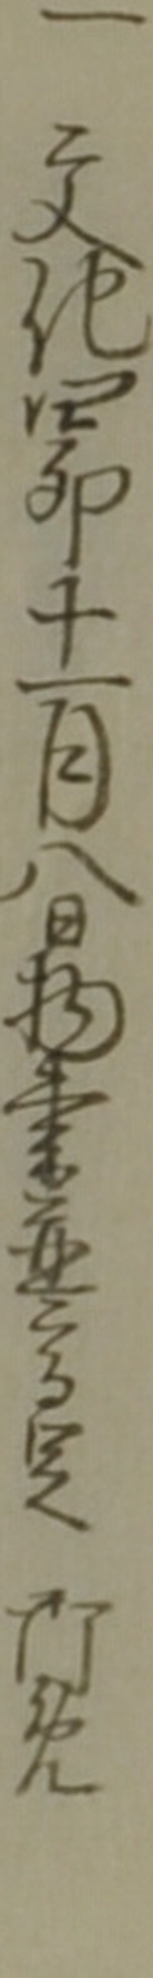一文化四卯十一月八日物書並高足御免
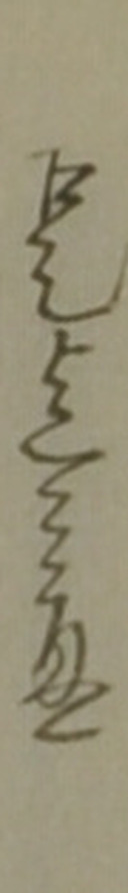是迄之通
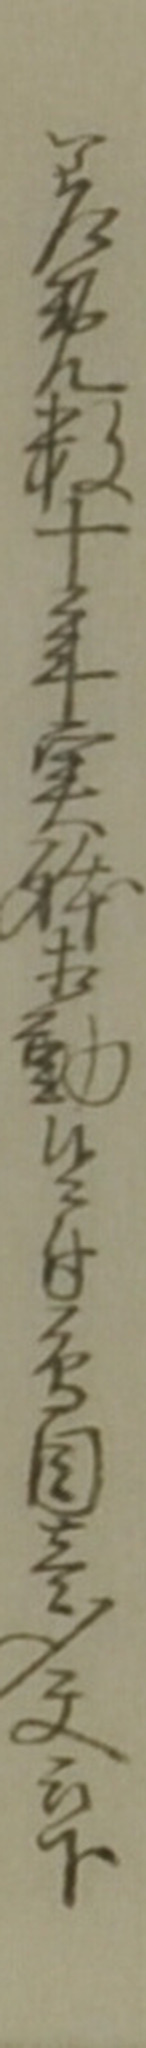差免数十年実体相勤候ニ付鳥目壱〆文被下
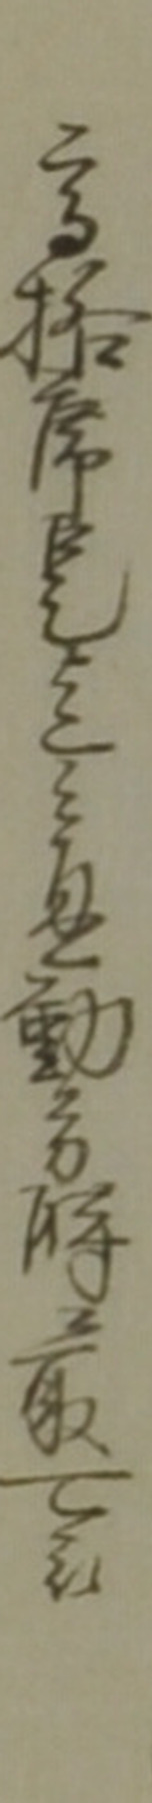高格席是迄之通勤方時ニ取可被
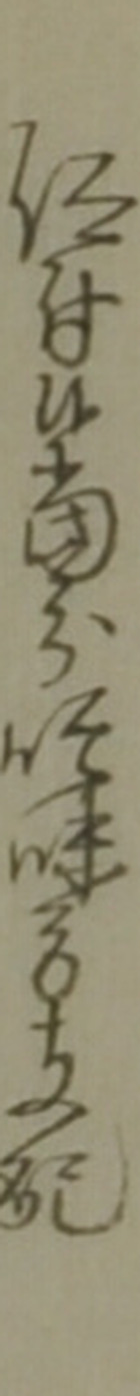仰付候当分吟味方支配
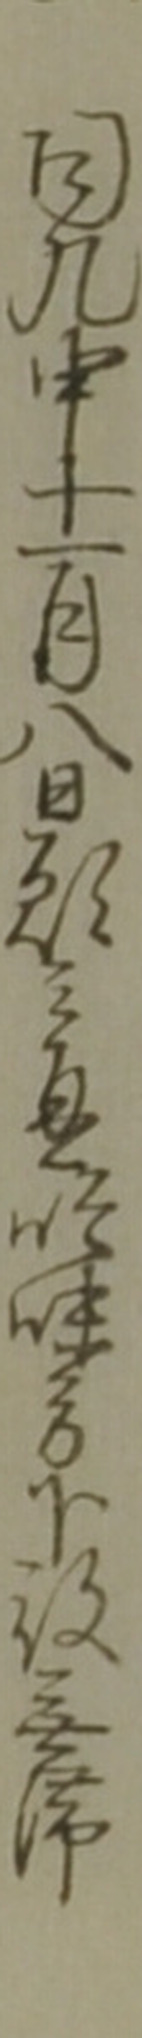一同九申十一月八日願之通吟味方下役無滞
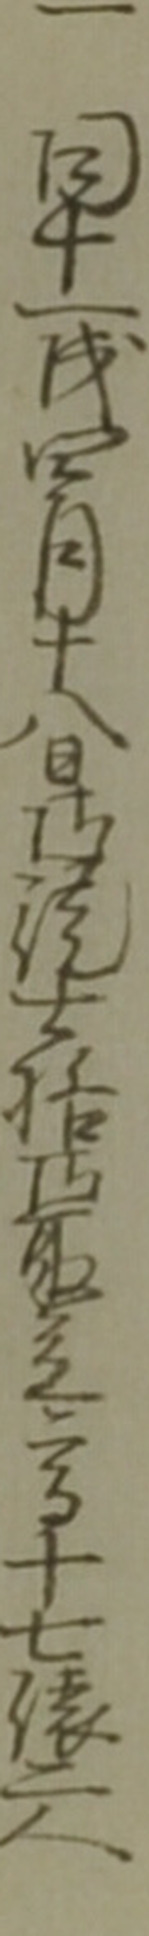一同十一戌四月十八日御徒士格御取立高十七俵二人
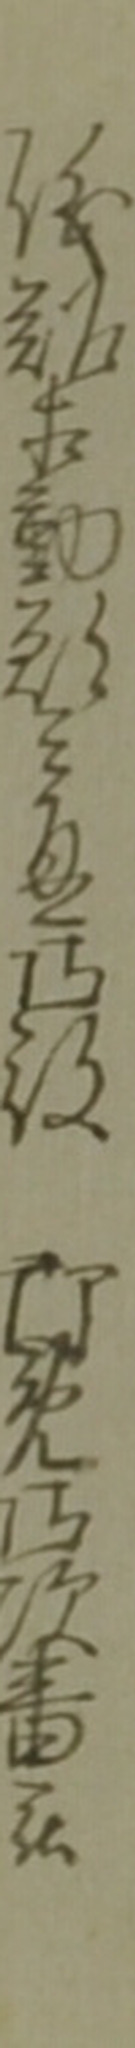儀難相勤願之通御役御免御次番被
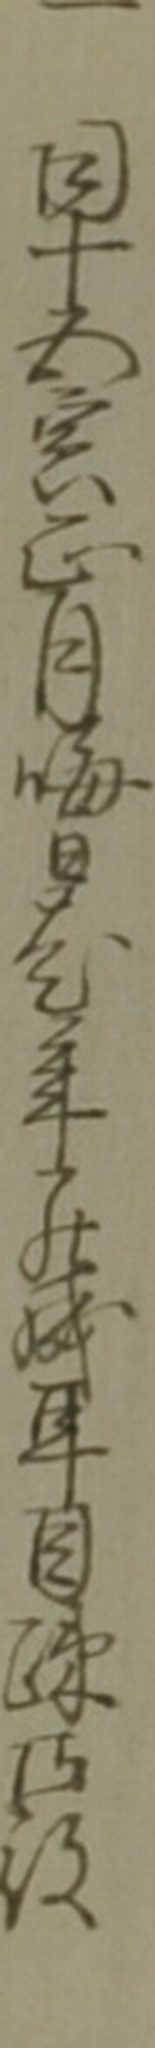一同十五寅正月晦日老年罷成耳目疎御役
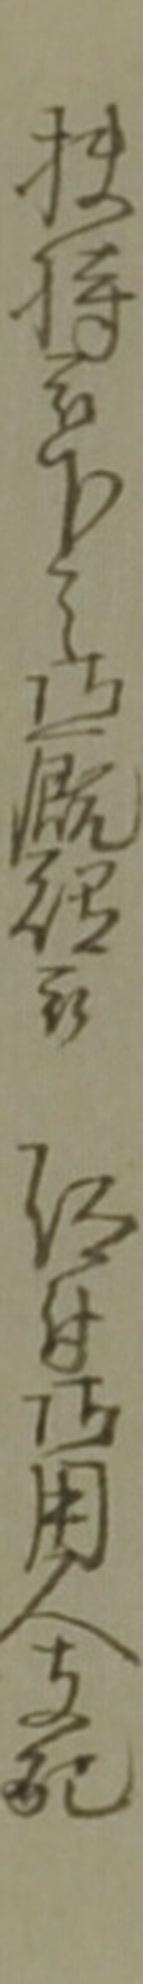扶持被下之御厩賄被仰付御用人支配

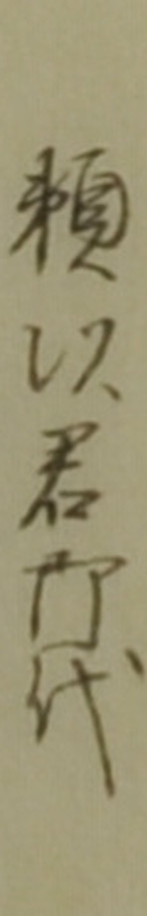頼以君御代
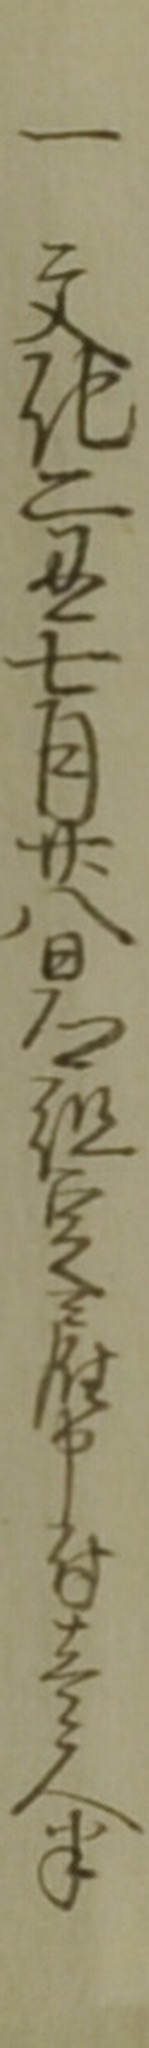一文化二丑七月廿八日郷組定雇申付壱人半
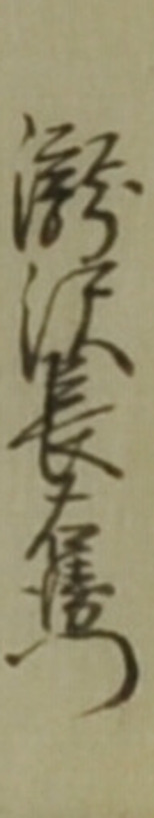瀧沢長右衛門
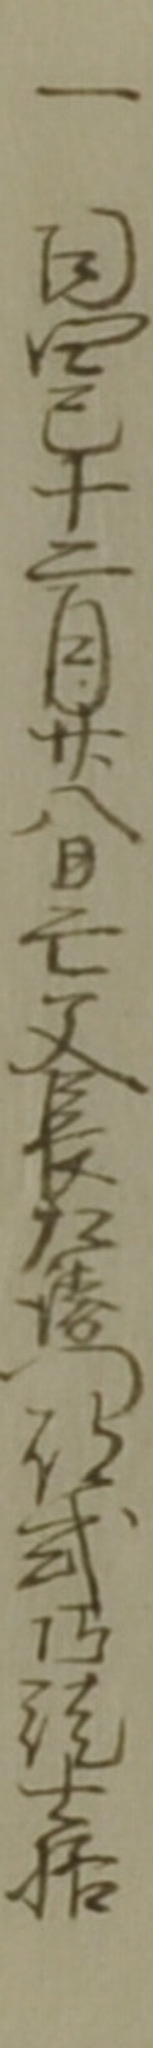一同四巳十二月廿八日亡父長左衛門跡式御徒士格
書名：無足諸士勤仕録（七）
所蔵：伊那市立高遠町図書館・合同会社AMANE
